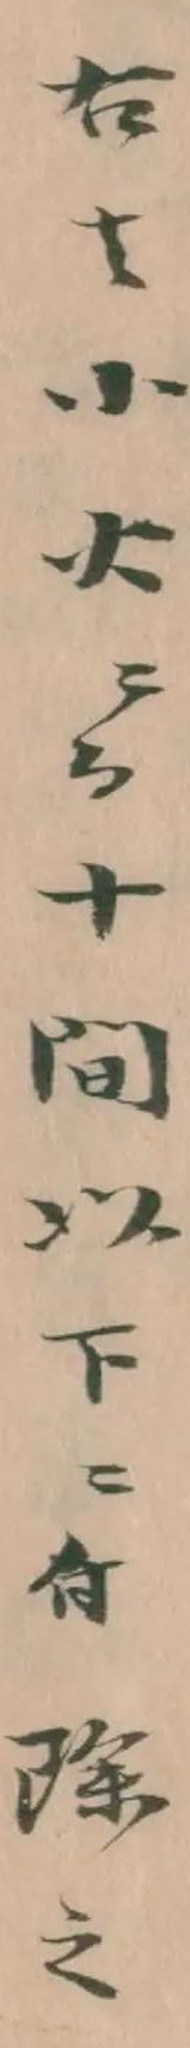右は小火にて十間以下に付除之
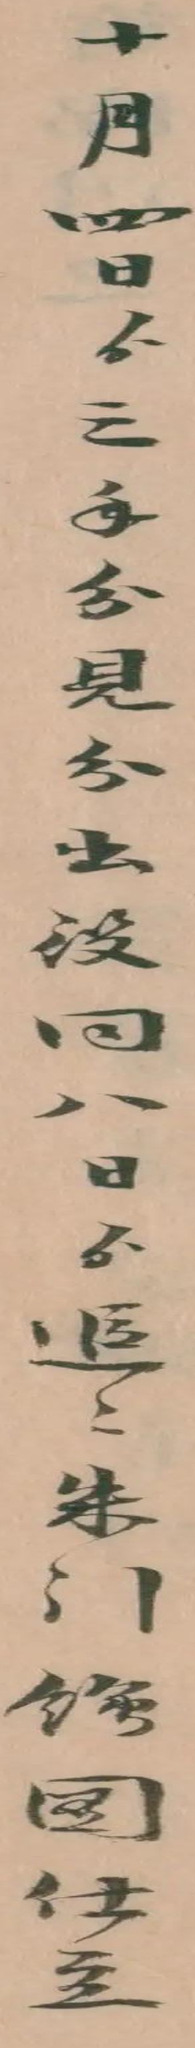十月四日ゟ三手分見分出役同八日ゟ追々朱引絵図仕立
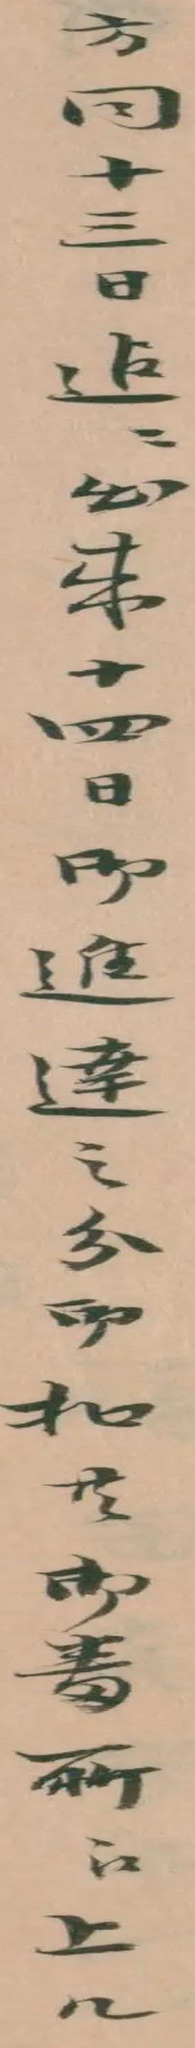方同十三日迄に出来十四日御進達之分御扣共御番所え上ル
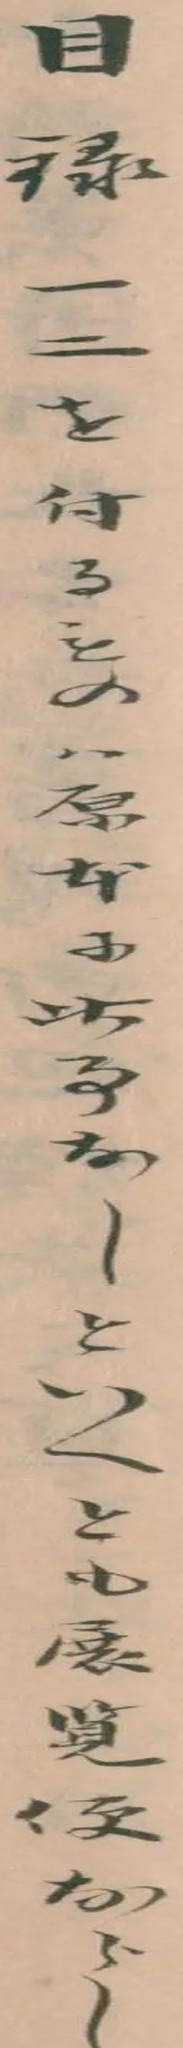目録一二を付るものは原本に此事なしといへとも展覧便ならし
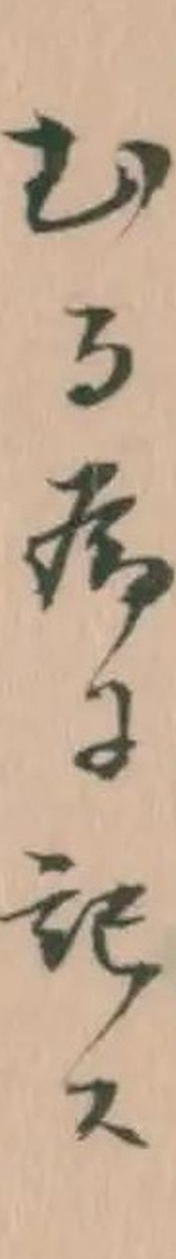むる為に記ス
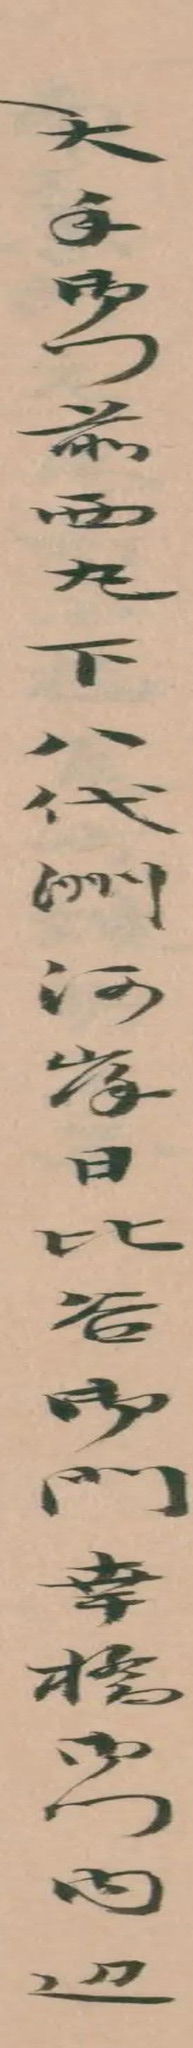壹大手御門前西丸下八代洲河岸日比谷御門幸橋御門内辺
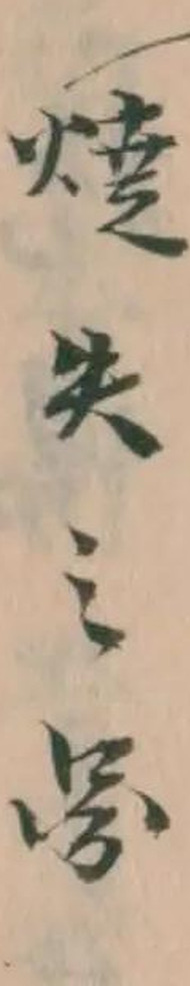焼失之図
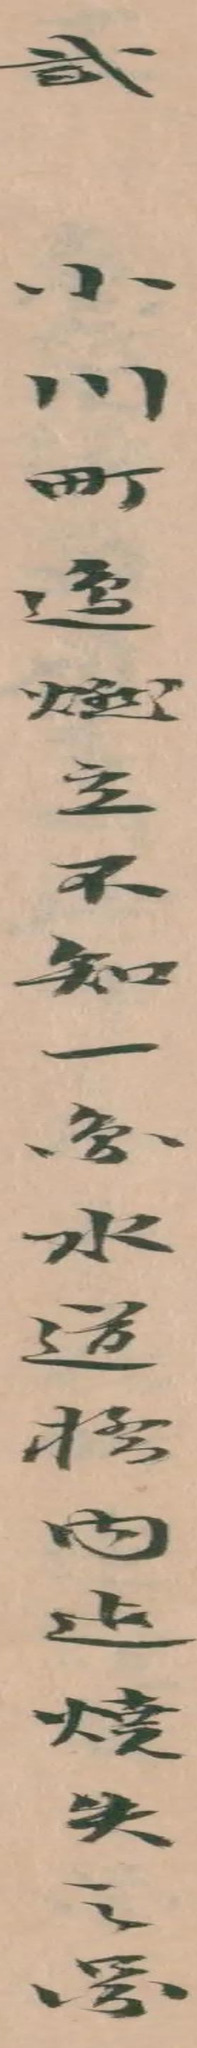弐小川町辺燃立不知一圓水道橋内迄焼失之図
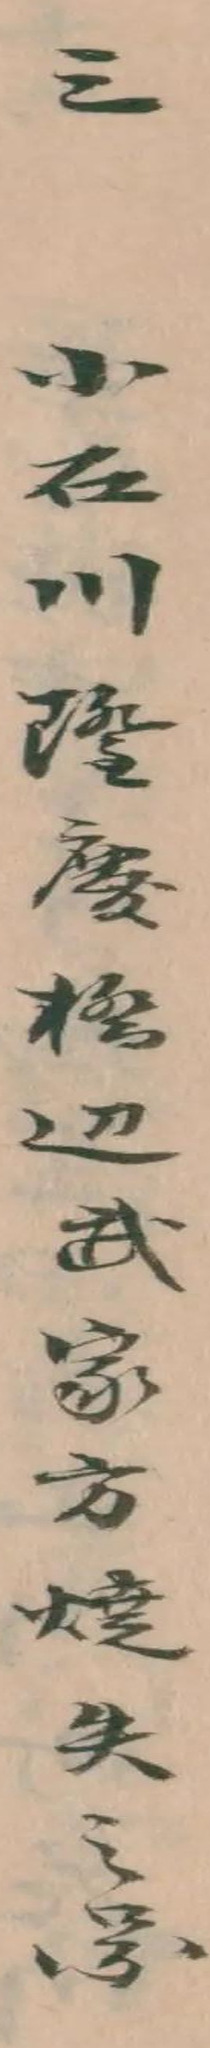三小石川隆慶橋辺武家方焼失之図
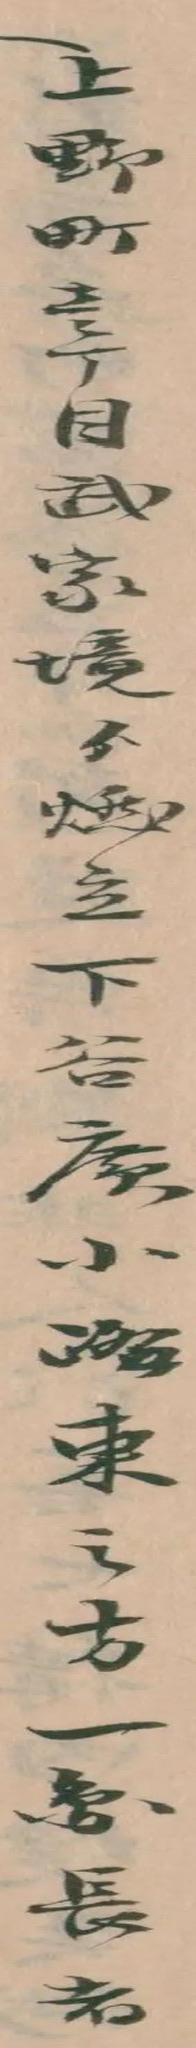四上野町壱丁目武家境ゟ燃立下谷広小路東之方一円長者
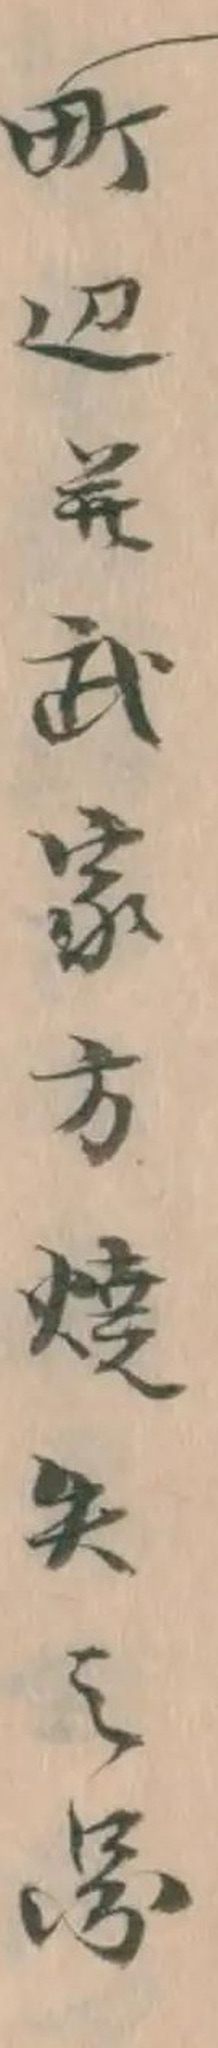町辺并武家方焼失之図
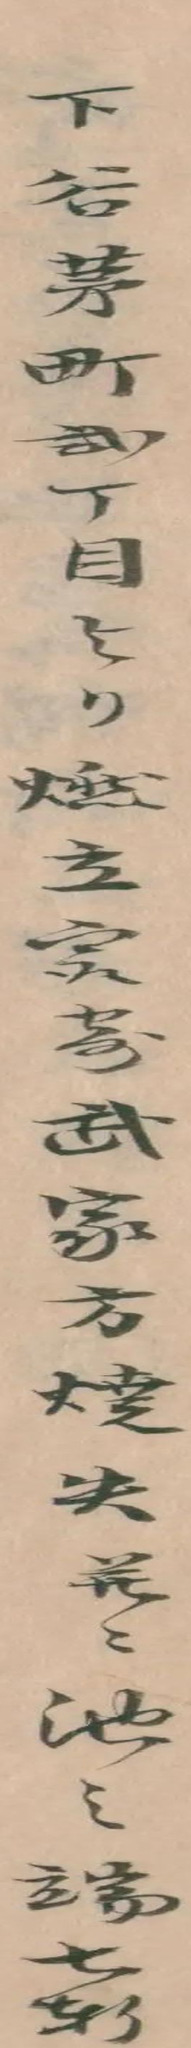五下谷茅町弐丁目より燃立最寄武家方焼失并に池之端七軒
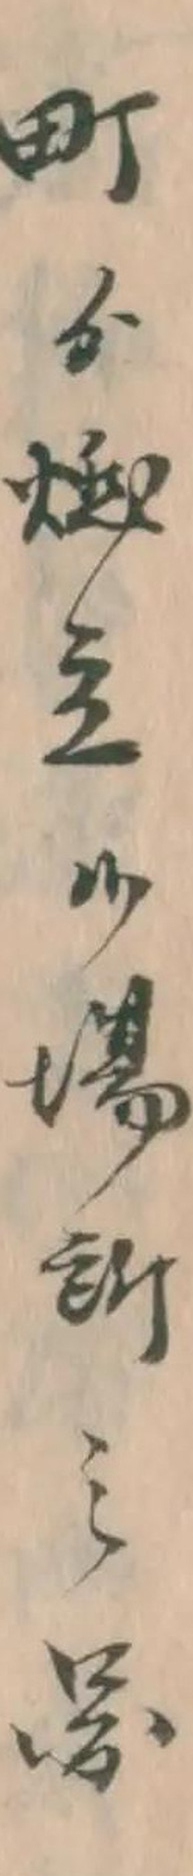町ゟ燃立候場所之図
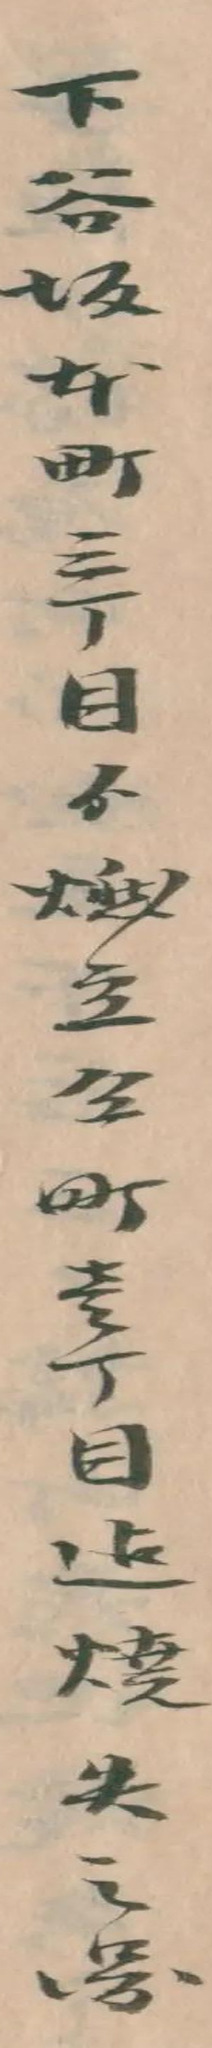六下谷坂本町三丁目ゟ燃立仝町壱丁目迄焼失之図

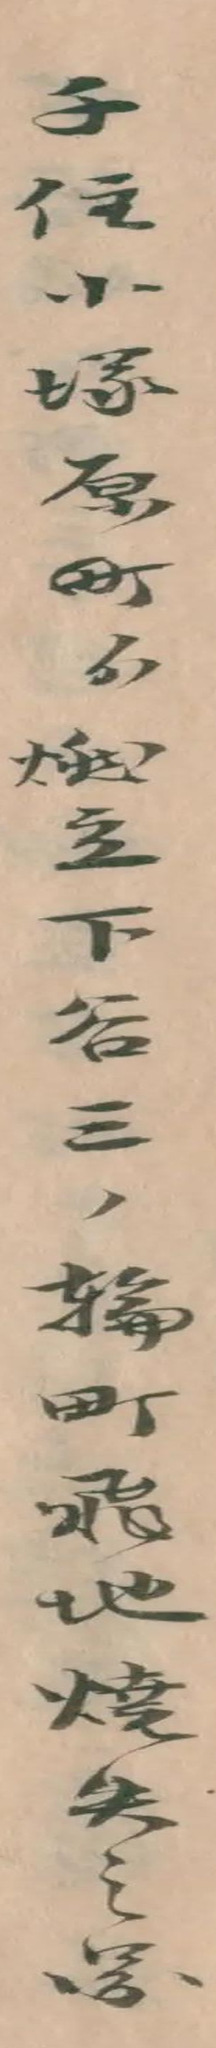七千住小塚原町ゟ燃立下谷三ノ輪町飛地焼失之図
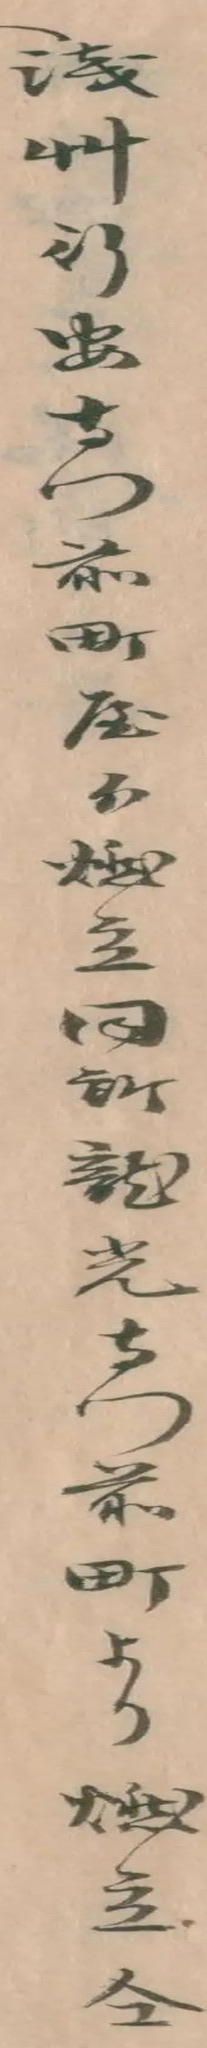八浅草行安寺門前町屋ゟ燃立同所龍光寺門前町より燃立仝
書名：地災撮要. 巻7-9(地震之部)
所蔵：国立国会図書館 National Diet Library, JAPAN
